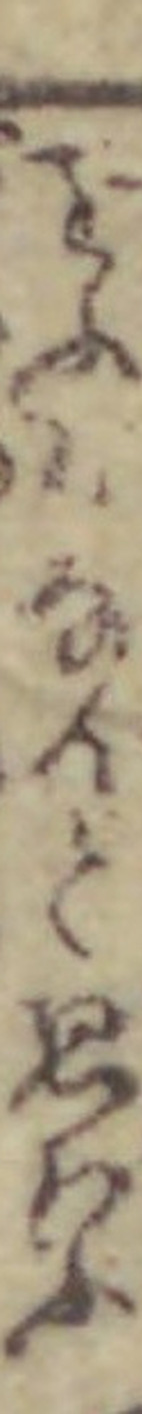をふがなんと思はふ
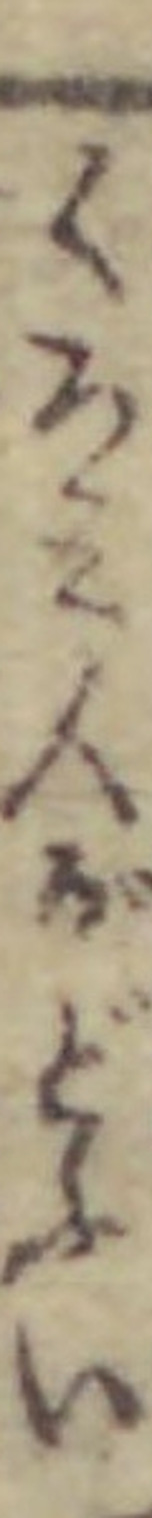くろみ人がどふい
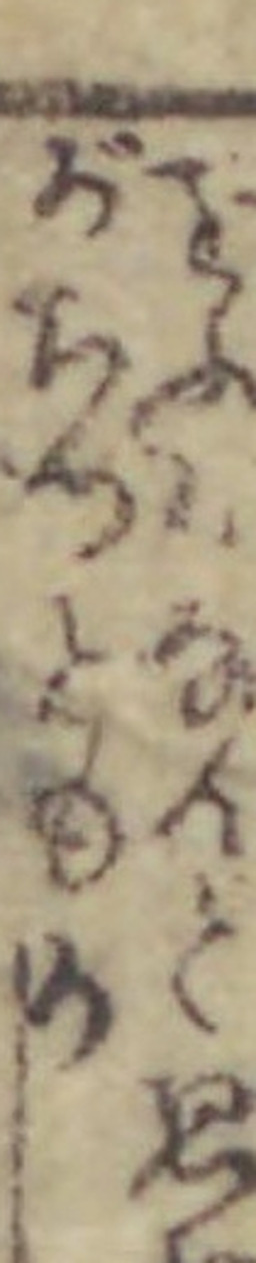がちつともか
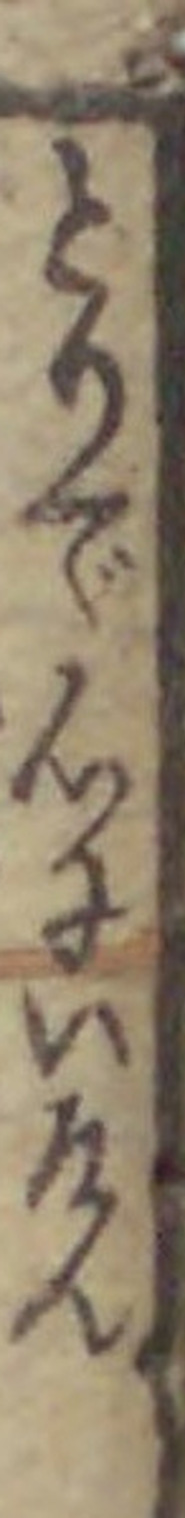とりで心にいけん
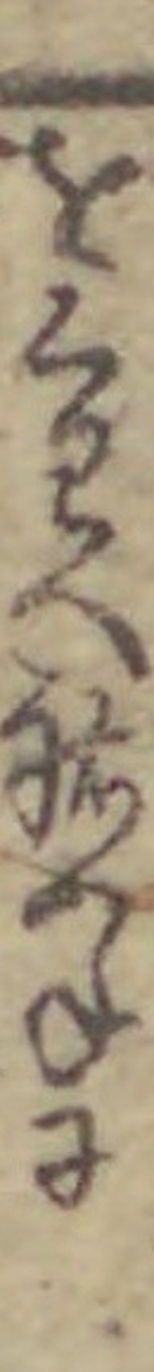をくわへ祐つねに
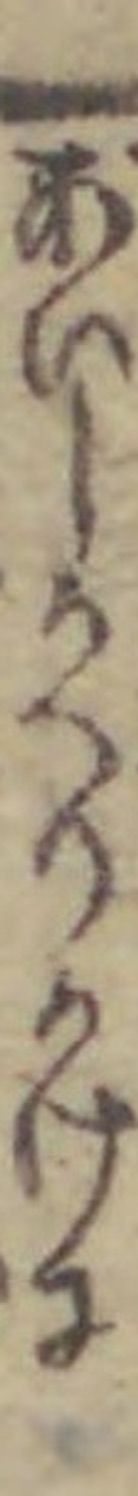あいしかへりかけに
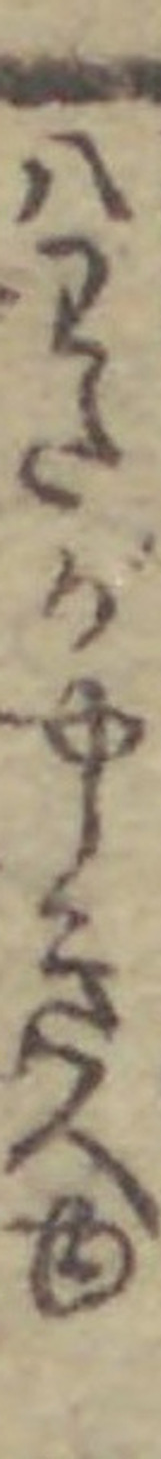八わたがやしきへゆ
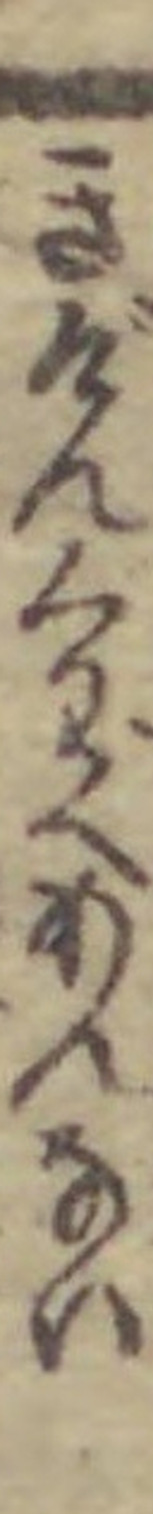きげんくわへあんない
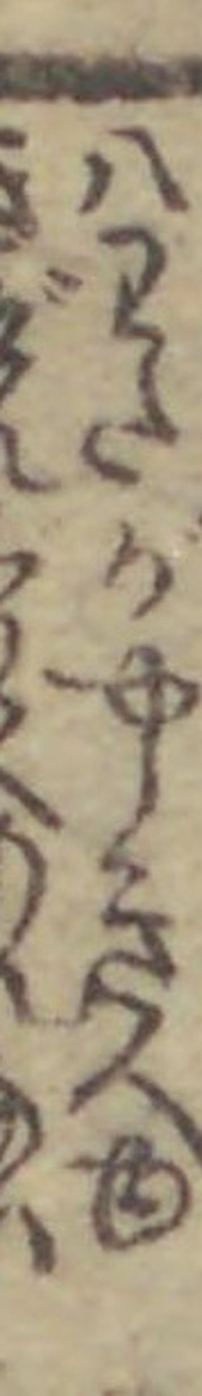八わたがやしきへゆ
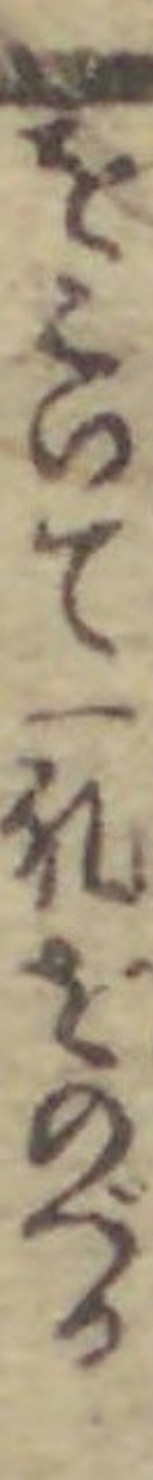をこいて一礼をのべる
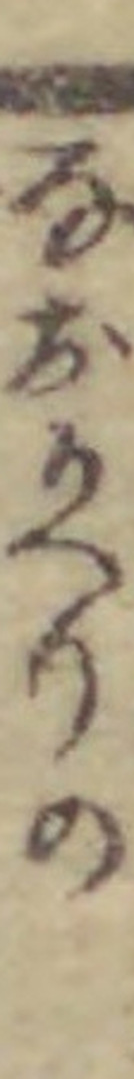なおかへりの
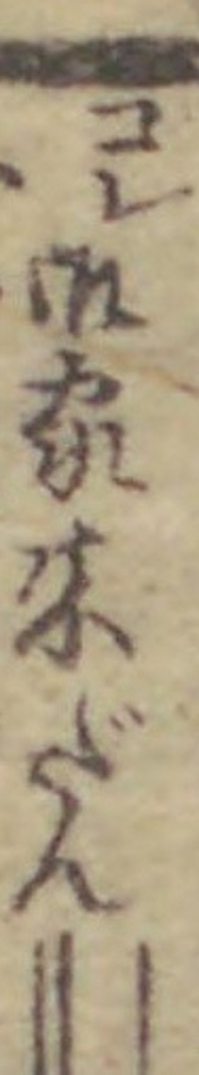コレ御家来だん
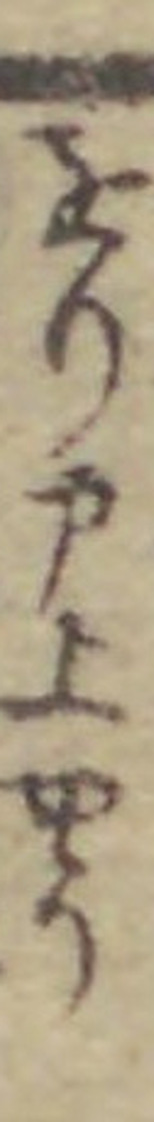をり申上やう
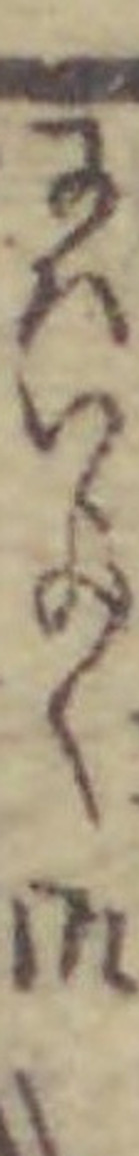にはいよ〳〵御
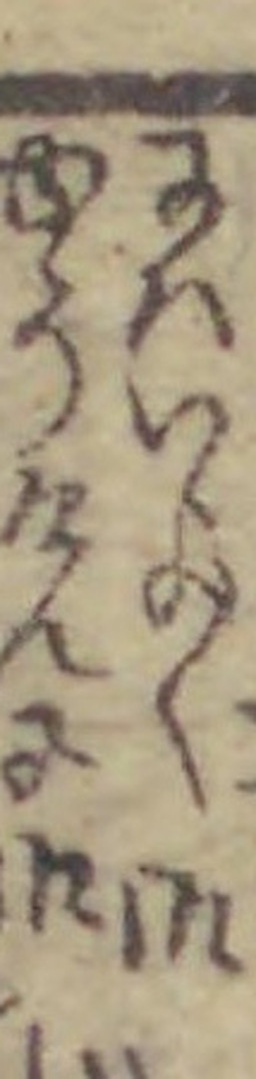ゆうけんに御
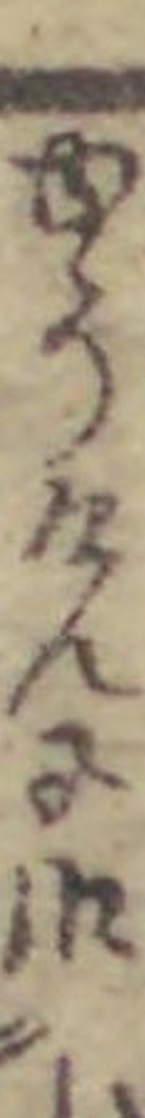ゆうけんに御
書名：間似合嘘言曽我 3巻
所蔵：国立国会図書館 National Diet Library, JAPAN
